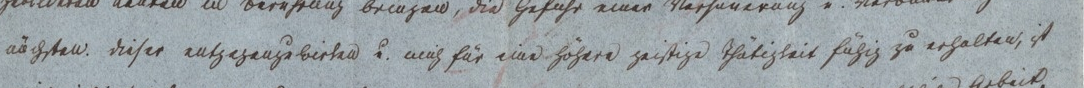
nächsten. Dieser entgegenzuwirken u. mich für eine höhere geistige Thätigkeit fähig zu erhalten, ist
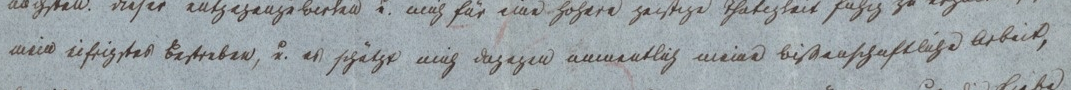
mein eifrigstes Bestreben, u. es schützt mich dagegen namentlich meine wissenschaftliche Arbeit,
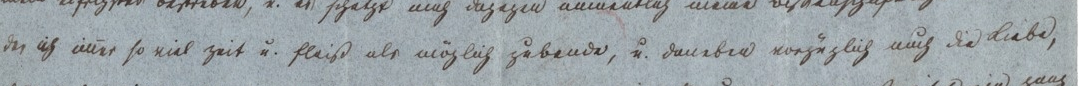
der ich immer so viel Zeit u. Fleiß als möglich zuwende, u. daneben vorzüglich auch die Liebe,
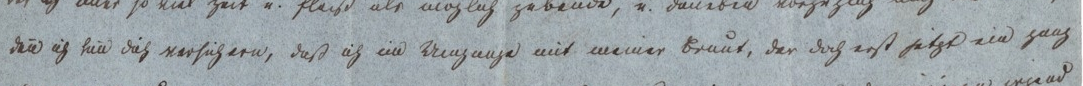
denn ich kann Dich versichern, daß ich im Umgange mit meiner Braut, der doch erst jetzt ein ganz
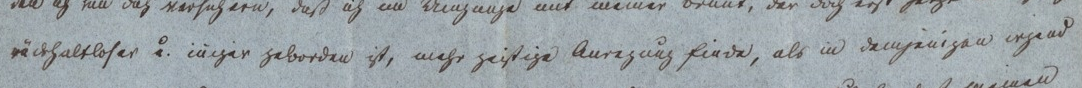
rückhaltloser u. inniger geworden ist, mehr geistige Anregung finde, als in demjenigen irgend
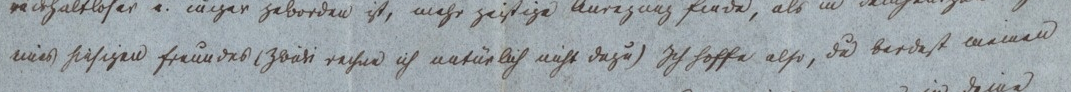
eines hiesigen Freundes ( Zwicki rechne ich natürlich nicht dazu). Ich hoffe also, Du werdest meinen
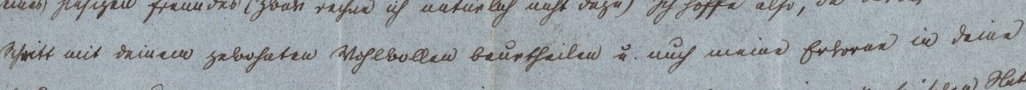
Schritt mit Deinem gewohnten Wohlwollen beurtheilen u. auch meine Erkorne in Deine
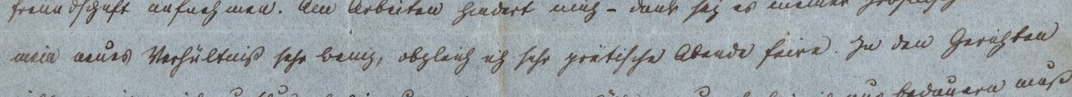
mein neues Verhältniß sehr wenig, obgleich ich sehr poëtische Abende feire. In den Gerichten
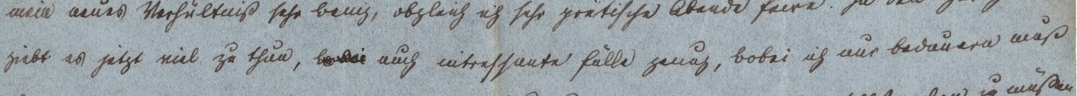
giebt es jetzt viel zu thun, wobei auch intressante Fälle genug, wobei ich nur bedauern muß
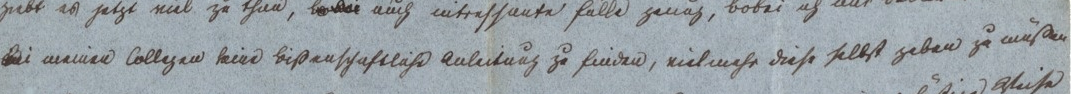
bei meinen Collegen keine wissenschaftliche Anleitung zu finden, vielmehr diese selbst geben zu müssen.
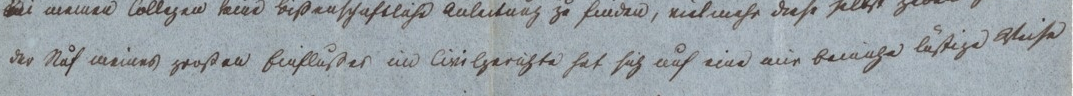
Der Ruf meines großen Einflusses im Civilgerichte hat sich auf eine mir beinahe lästige Weise
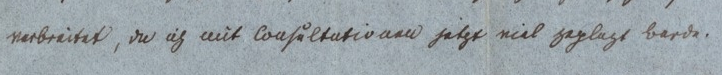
verbreitet, da ich mit Consultationen jetzt viel geplagt werde.
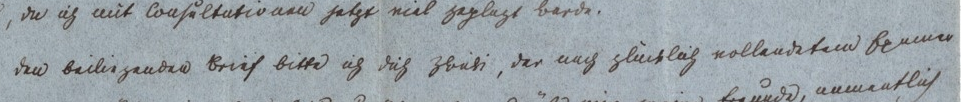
Den beiliegenden Brief bitte ich Dich Zwicki, der nach glücklich vollendetem Examen
